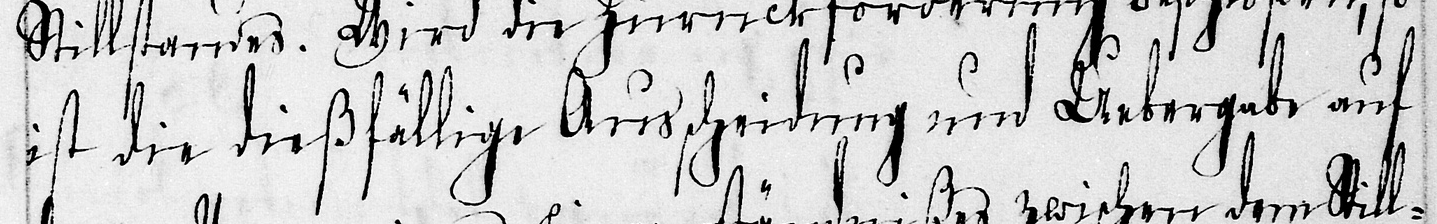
ist die dießfällige Ausscheidung und Uebergabe auf
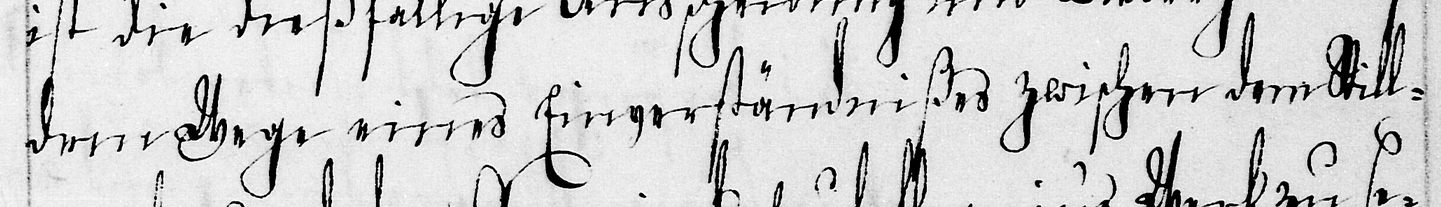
dem Wege eines Einverständnißes zwischen dem Stills¬
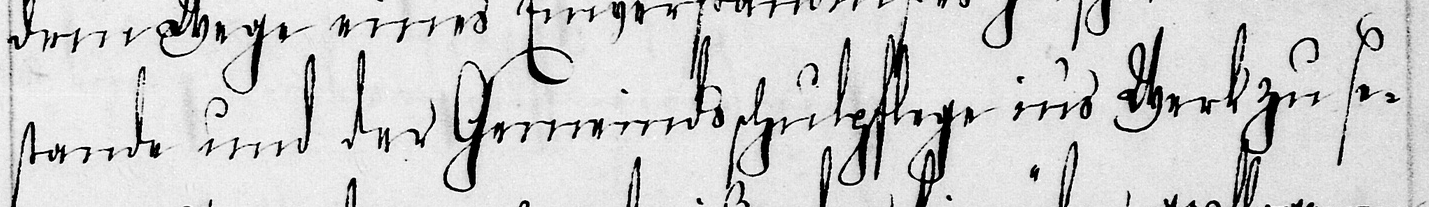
tande und der Gemeindsschulpflege ins Werk zu se¬
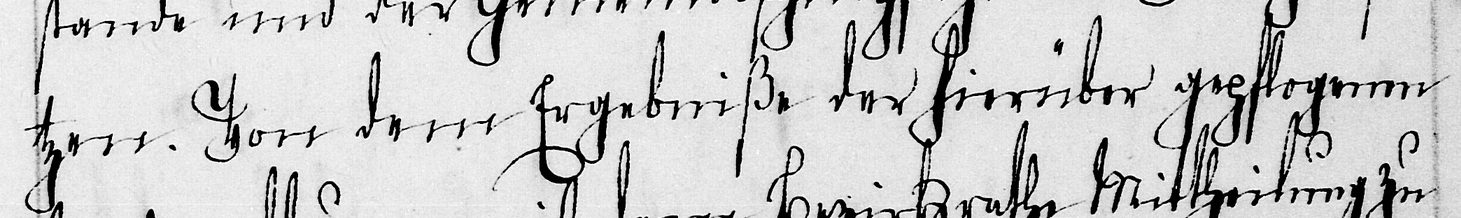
tzen. Von dem Ergebniße der hierüber gepflogenen
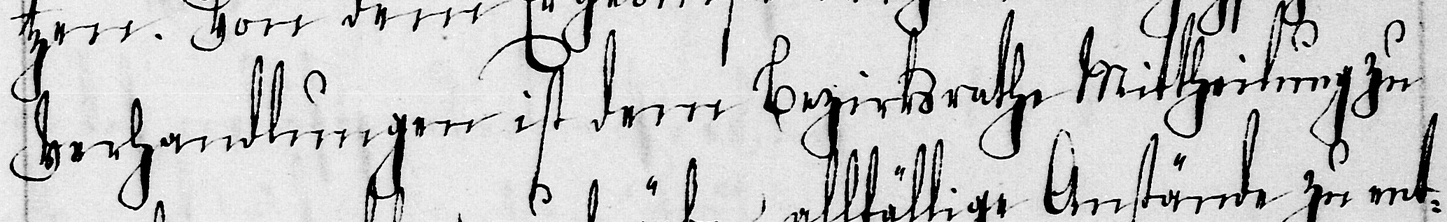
Verhandlungen ist dem Bezirksrathe Mittheilung zu
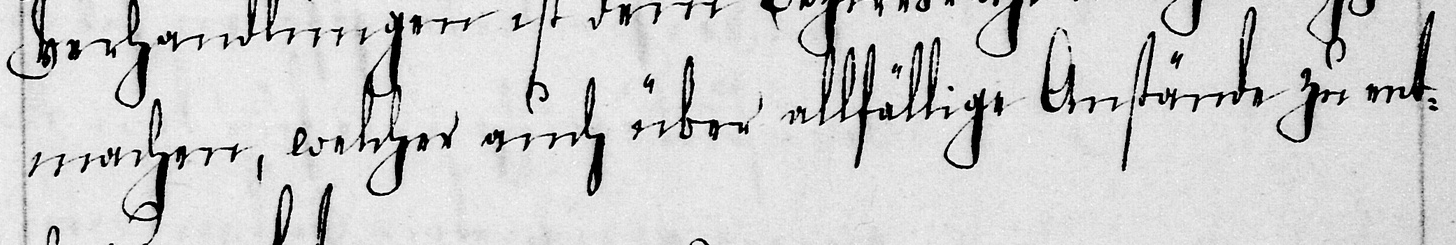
machen, welcher auch über allfällige Anstände zu ents¬
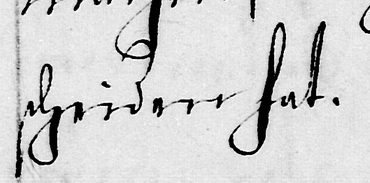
cheiden hat.
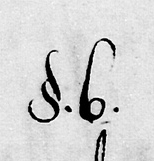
§. 6.
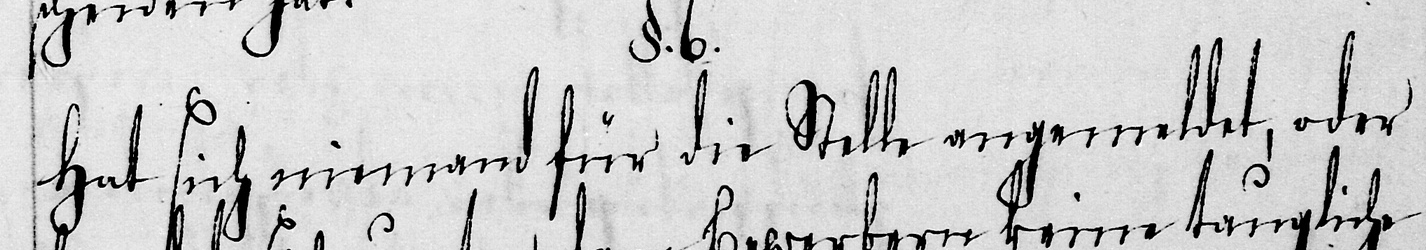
Hat sich niemand für die Stelle angemeldet, oder
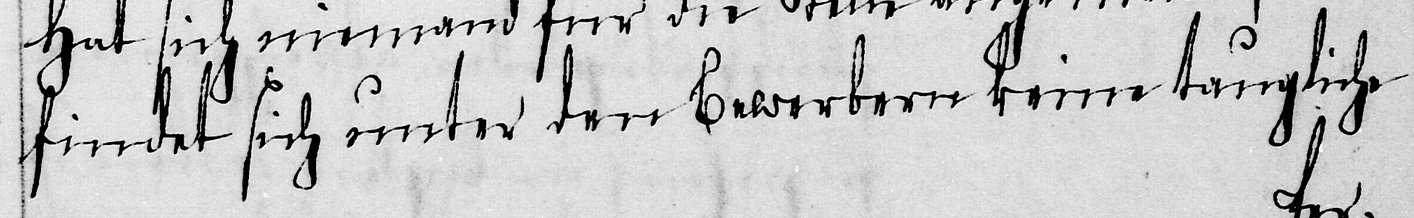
findet sich unter den Bewerbern keine taugliche
